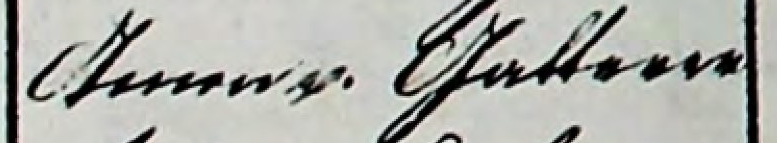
Anna v. Galterer
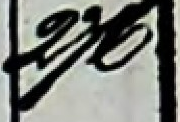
276
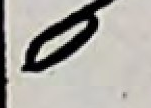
6
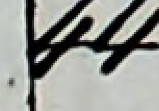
44
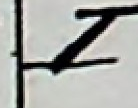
I
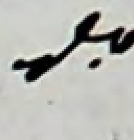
do
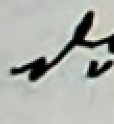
do
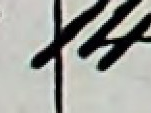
14
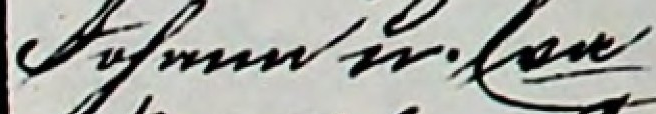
Johann u. Eva
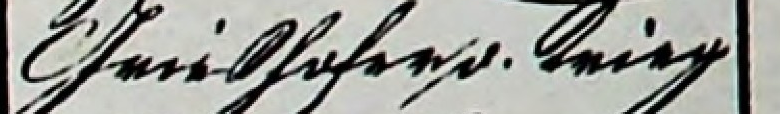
Grieshofer v. Krieg
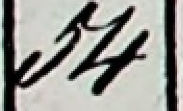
54
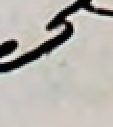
5
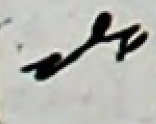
do
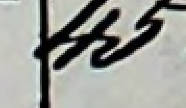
45
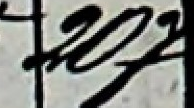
207
